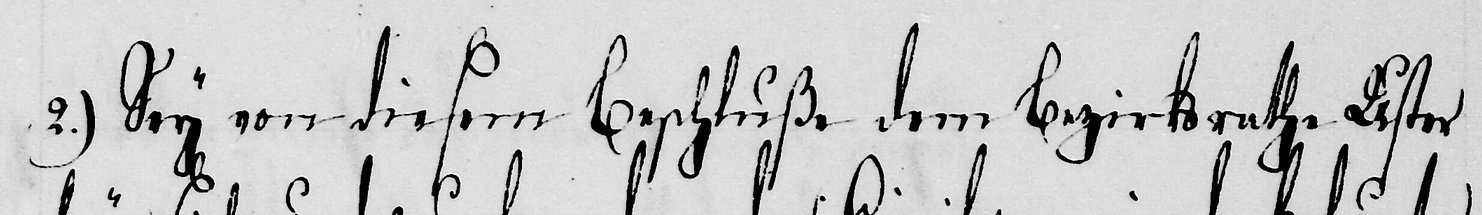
2.) Sey von diesem Beschluße dem Bezirksrathe Uster
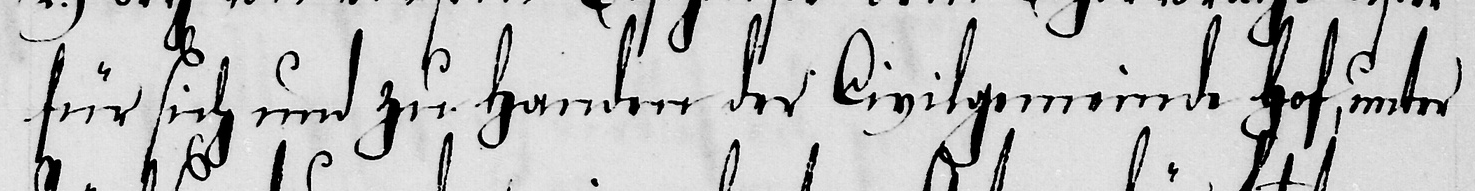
für sich und zu Handen der Civilgemeinde Hof, un¬
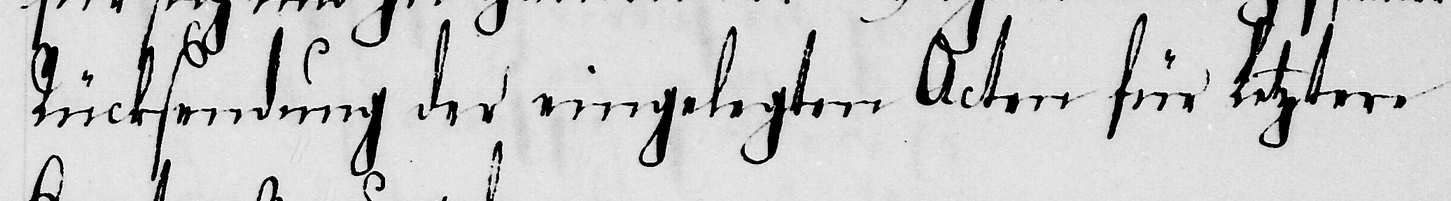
Rücksendung der eingelegten Acten für Letztere
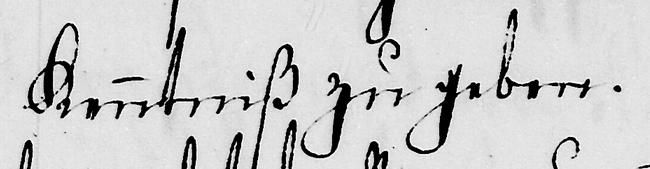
Kenntniß zu geben.
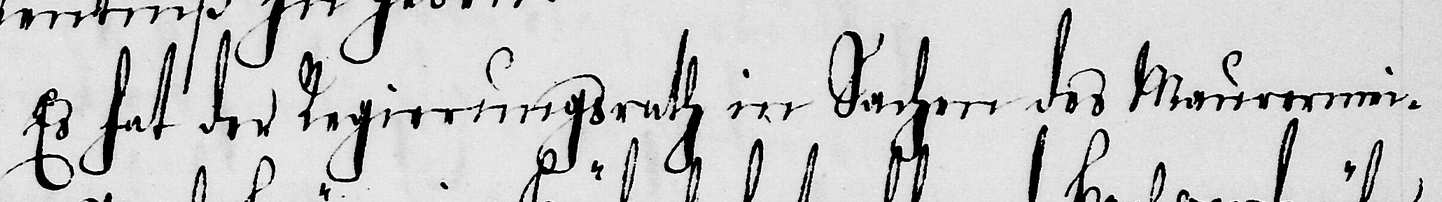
Es hat der Regierungsrath in Sachen des Maurermei¬
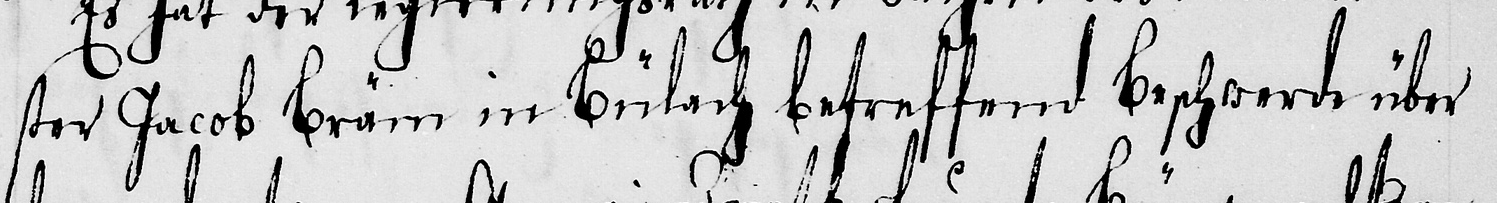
ster Jacob Bräm in Bülach betreffend Beschwerde über
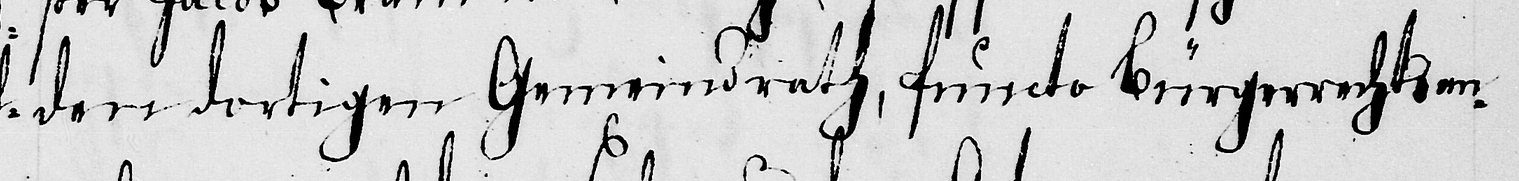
den dortigen Gemeindrath, Puncto Bürgerrechtsan¬
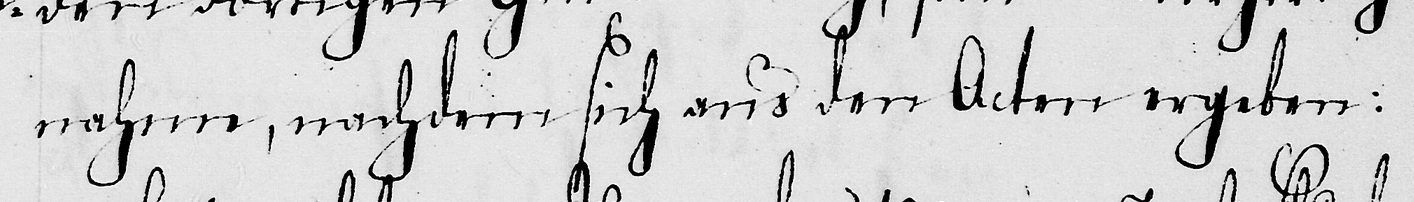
nahme, nachdem sich aus den Acten ergeben:
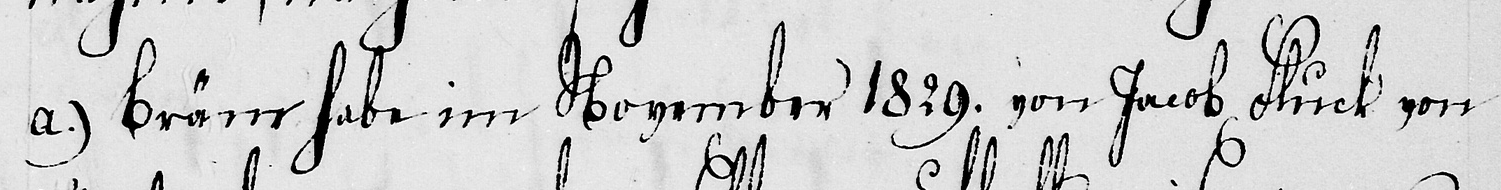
a.) Bräm habe im November 1829. von Jacob Fluck von
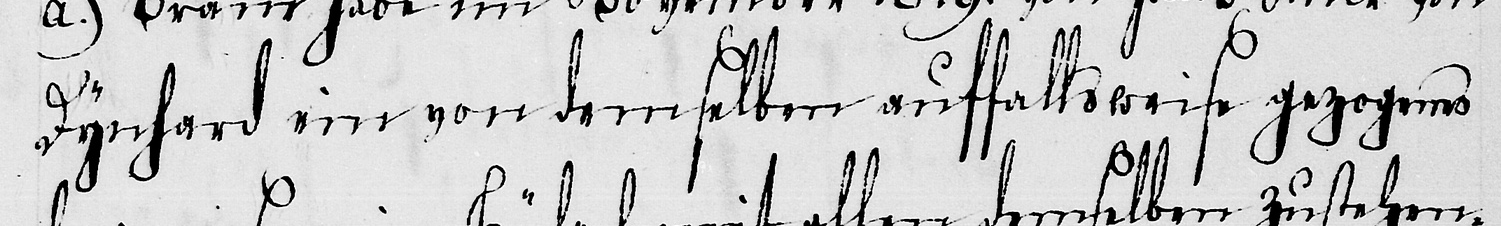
Dynhard ein von demselben auffallsweise gezogenes
